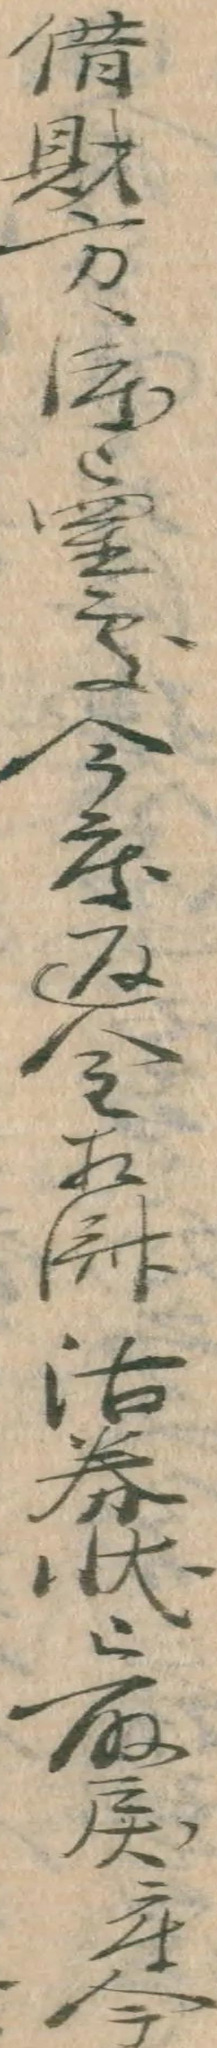借財方へ渡被置處今度返金相済沽券状被取戻ニ付今
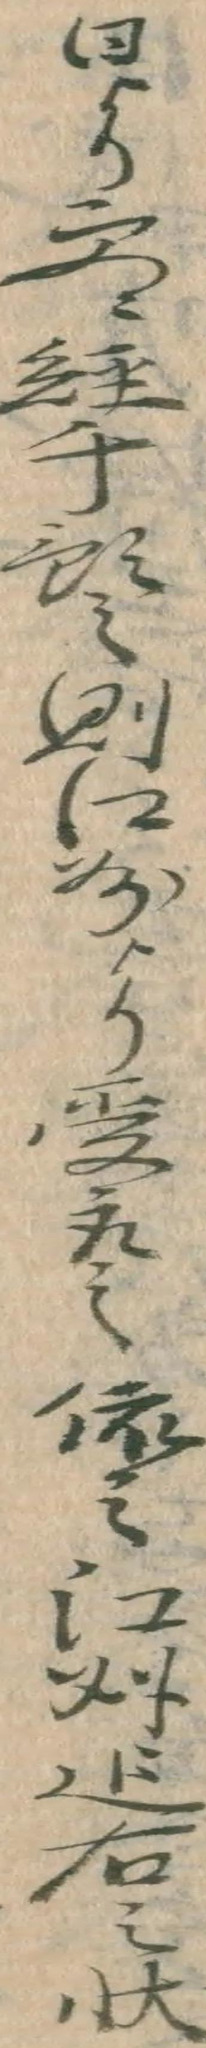日より更ニ経干預之則江州より受取之依之江州迄右之状
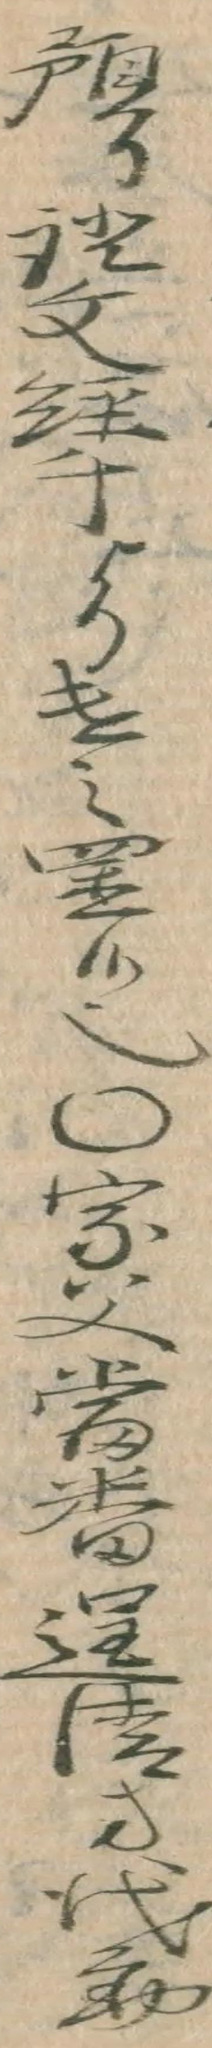預り證文経千より遣之置候也〇家父當番逞清方ヘ代勤
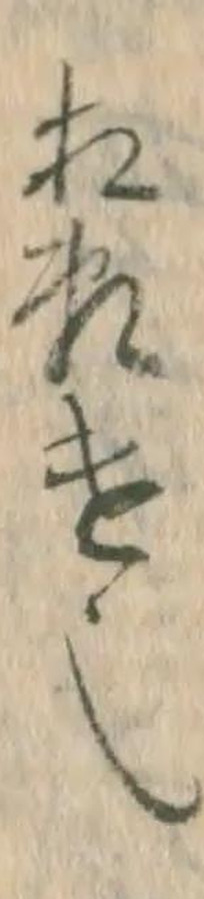相頼遣也
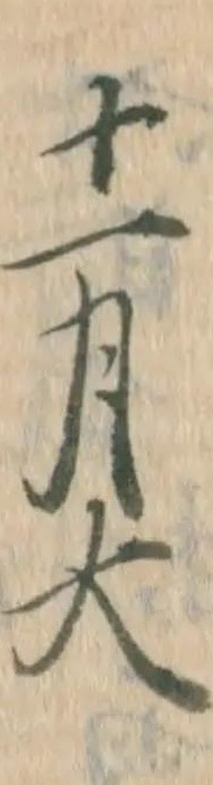十一月大
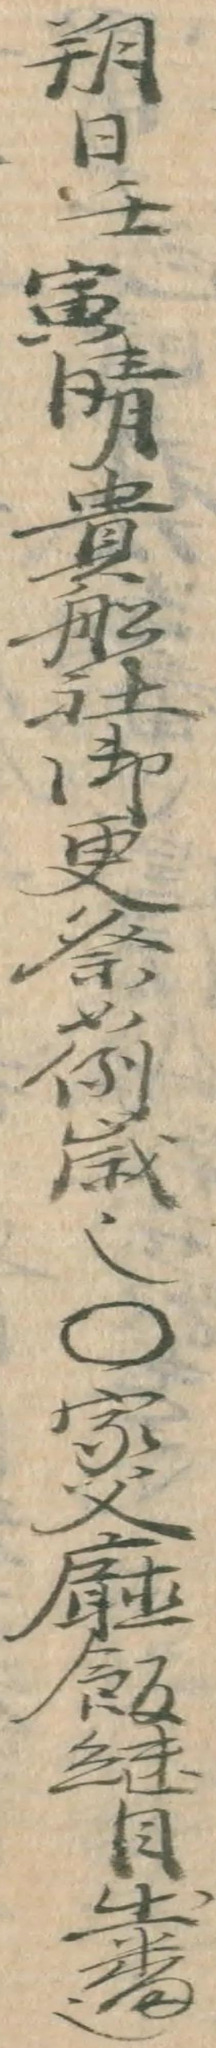朔日壬寅晴貴船社御更祭如例歳也○家父廳飯継目出番也
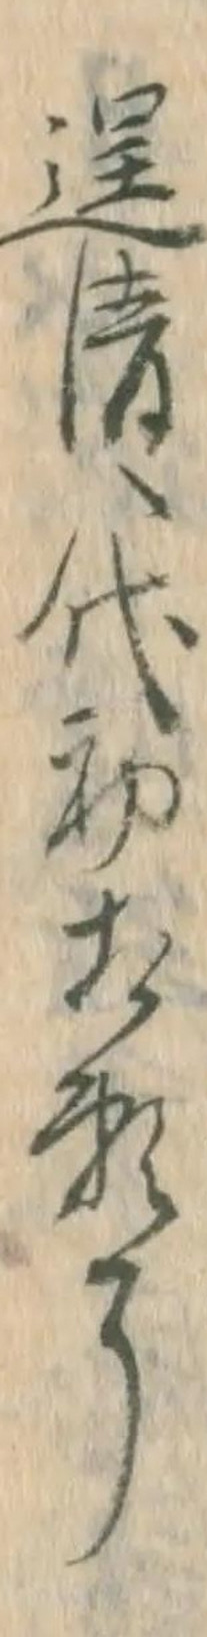逞清へ代勤相頼了

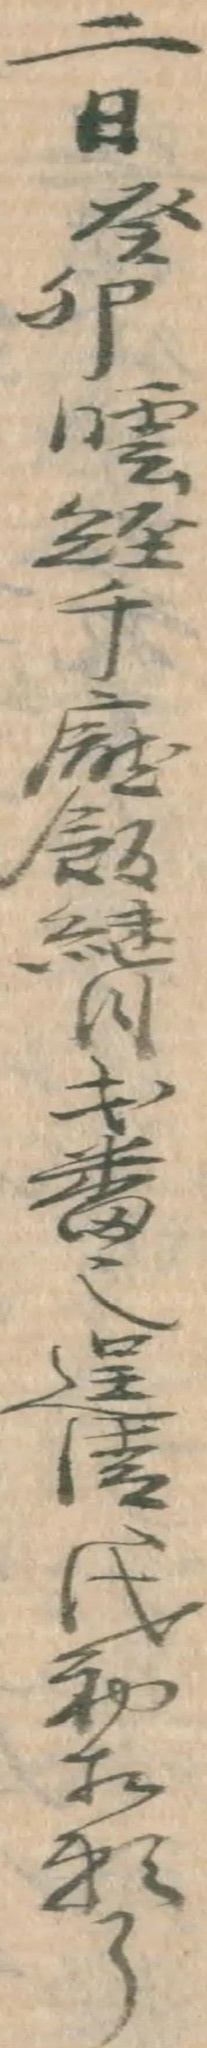二日癸卯曇経千廳飯継目義番也逞清代勤相頼了
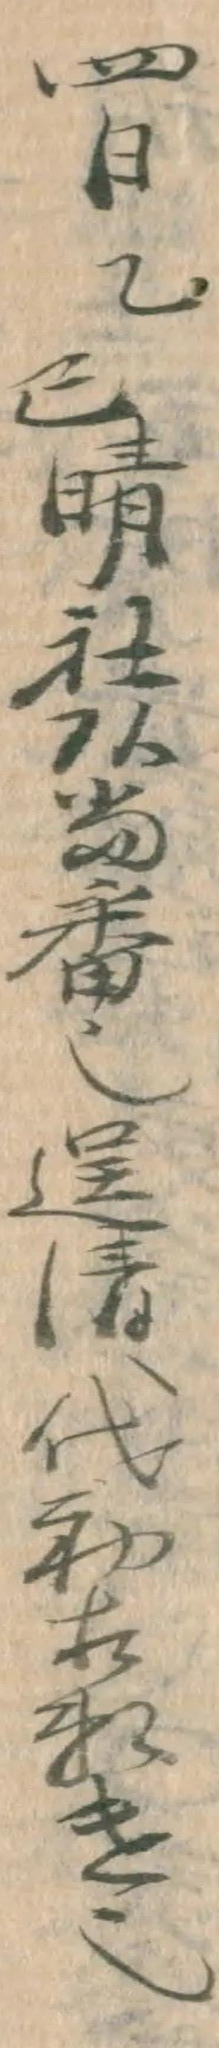四日乙巳晴社頭當番也逞清代勤相頼遣也
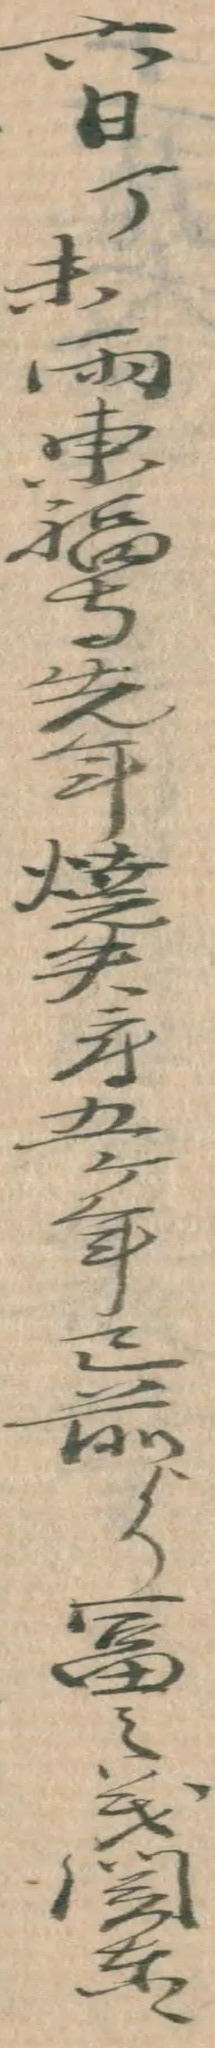六日丁未雨東福寺先年焼失二付五ヶ年已前より冨之義関東へ
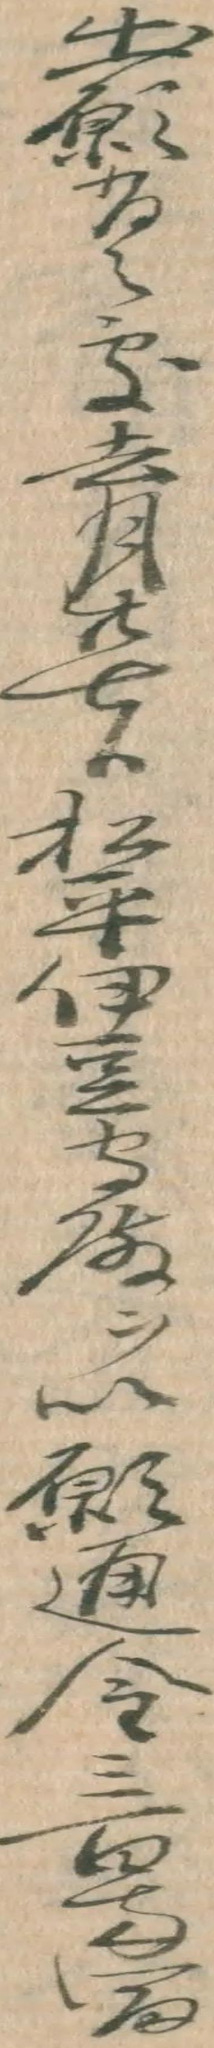出願有之處去月廿七日松平伊豆守殿ヲ以願通金三百両冨
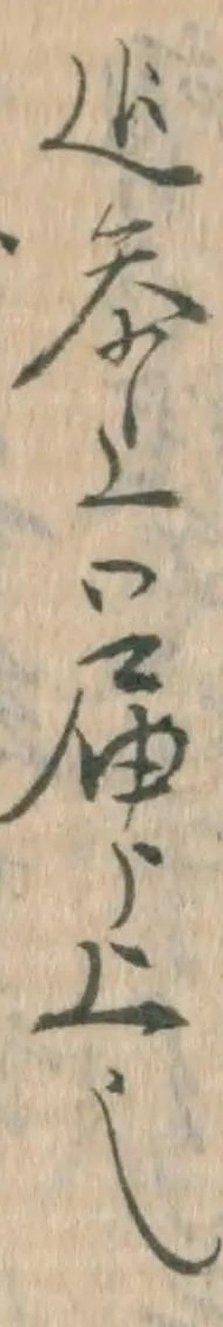迄参上御届被上之
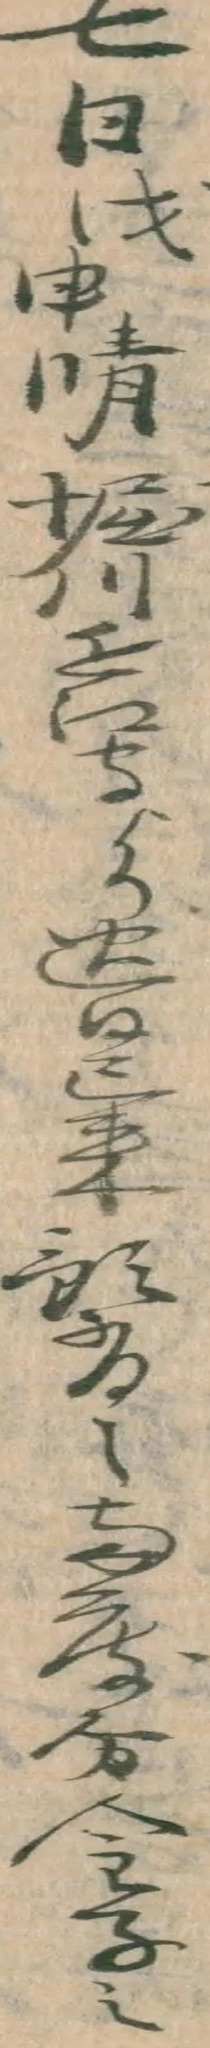七日戊申晴堀川近江守より過日已来預有之両度分金子之
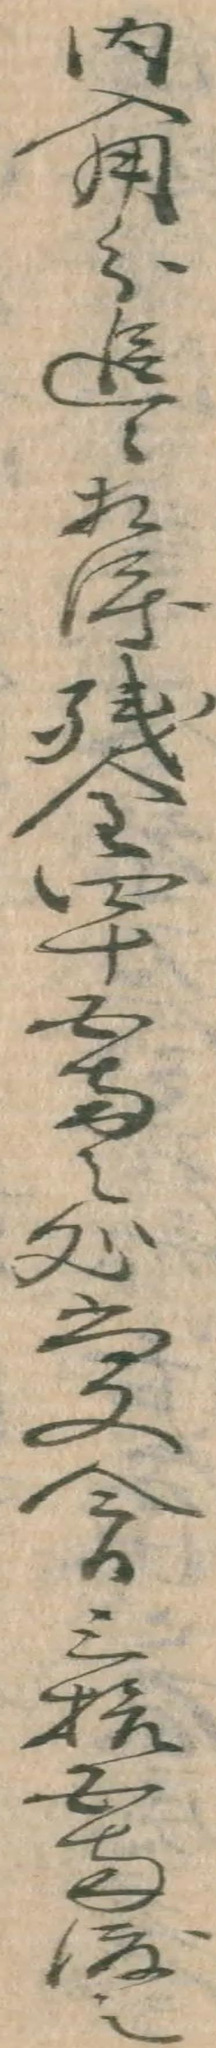内入用分追〻相渡残金四十五両之処尚又今日三拾五両渡之
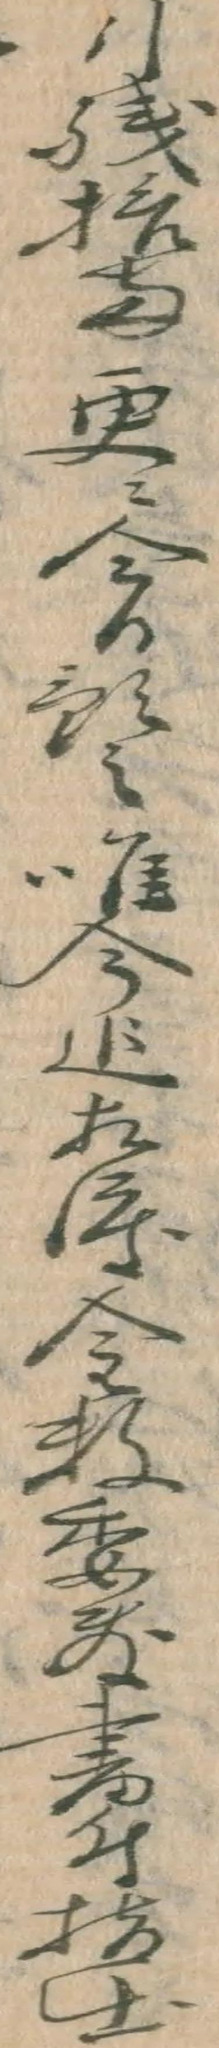引残拾両更に今日預之唯今迄相渡金数委敷書付指出
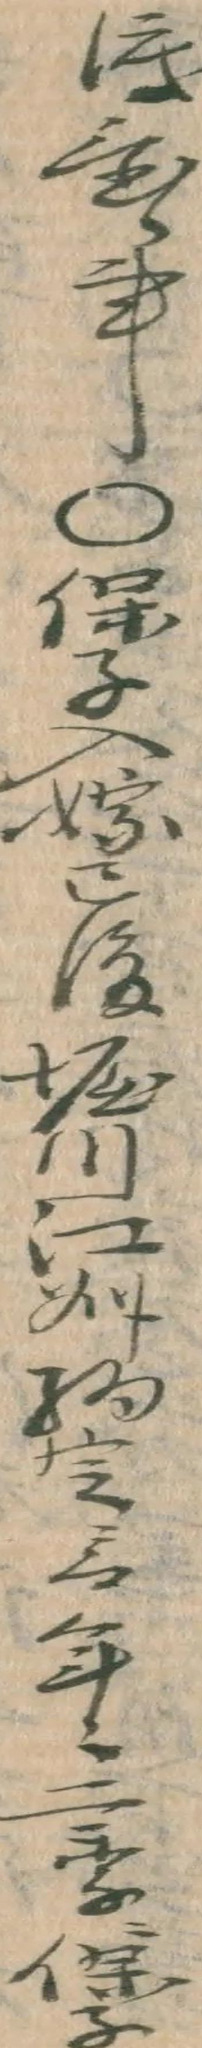渡置候事○保子入嫁已後堀川江州約定ニ而年々二季に保子
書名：賀茂社記録. 第65冊
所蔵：国立国会図書館 National Diet Library, JAPAN
